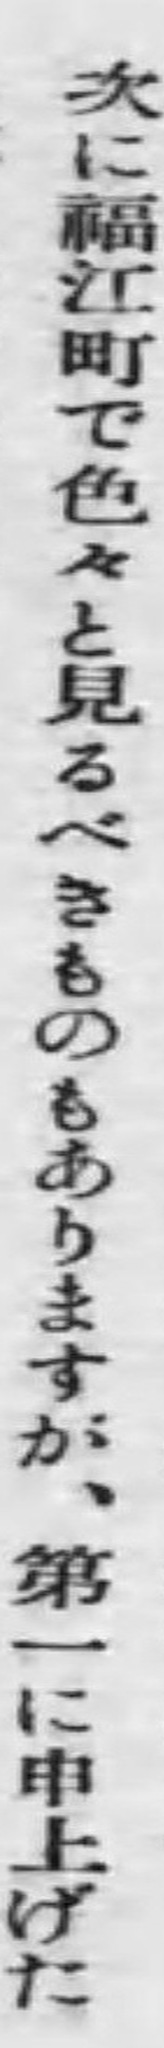次に福江町で色々と見るべきものもありますが、第一に申上げた
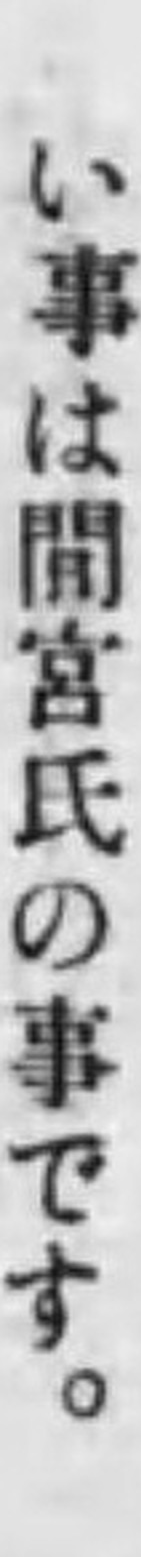い事は間宮氏の事です。
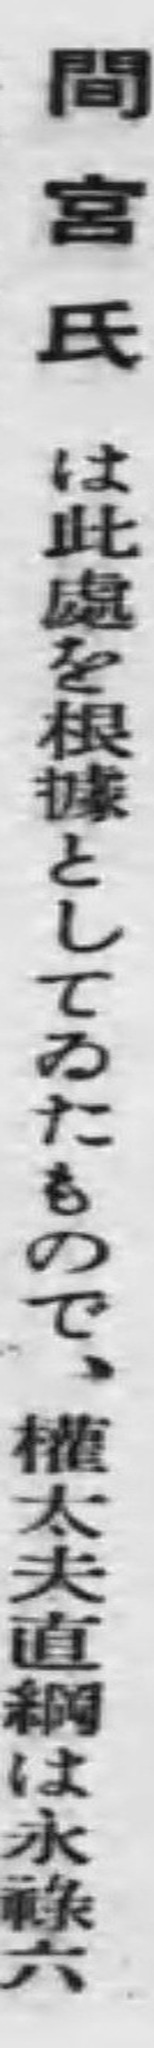間宮氏は此処を根拠としてゐたもので、権太夫直綱は永禄六
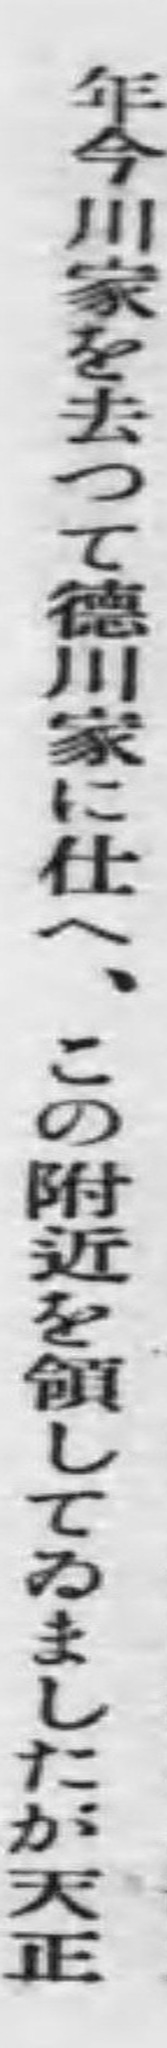年今川家を去つて徳川家に仕へ、この附近を領してゐましたが天正
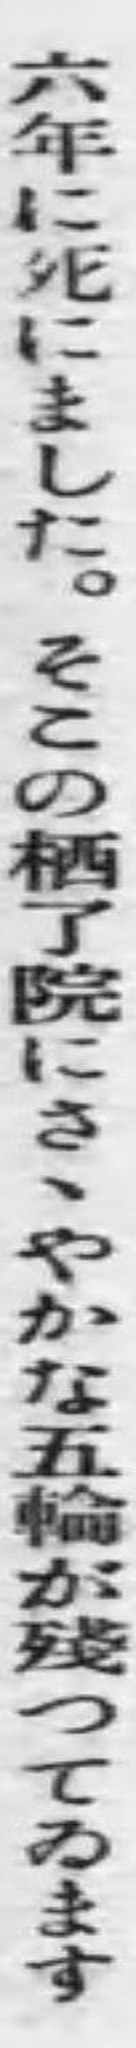六年に死にました。そこの栖了院にさゝやかな五輪が残つてゐます
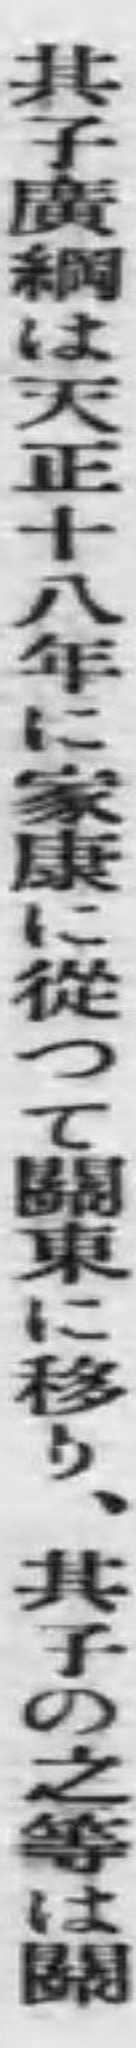其子広綱は天正十八年に家康に従つて関東に移り、其子の之等は関
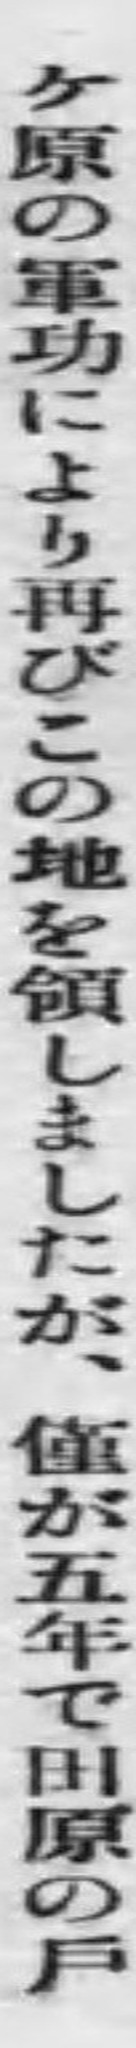ヶ原の軍功により再びこの地を領しましたが、僅が五年で田原の戸
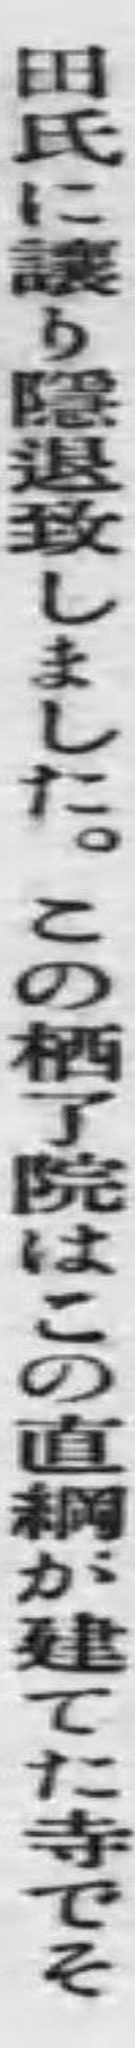田氏に譲り隠退致しました。この栖了院はこの直綱が建てた寺でそ
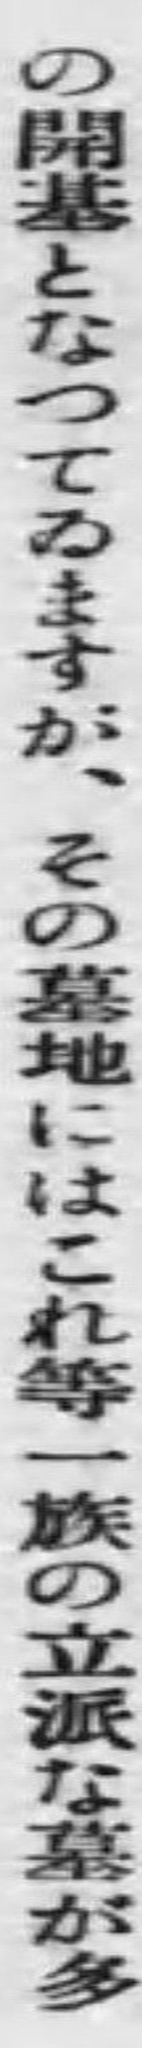の開基となつてゐますが、その墓地にはこれ等一族の立派な墓が多
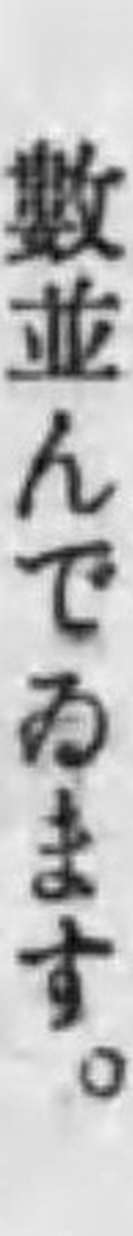数並んでゐます。
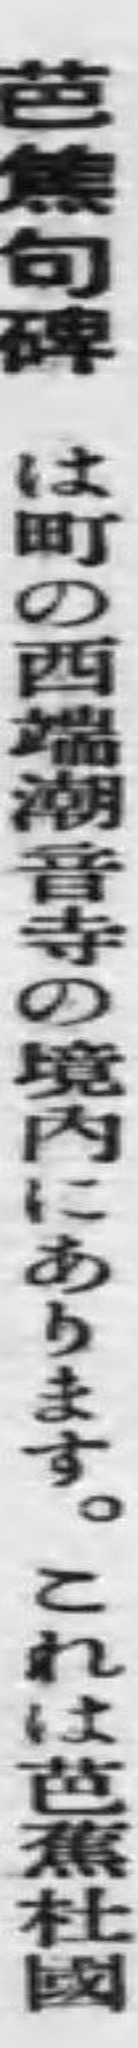芭集句碑は町の西端潮音寺の境内にあります。これは芭蕉杜国
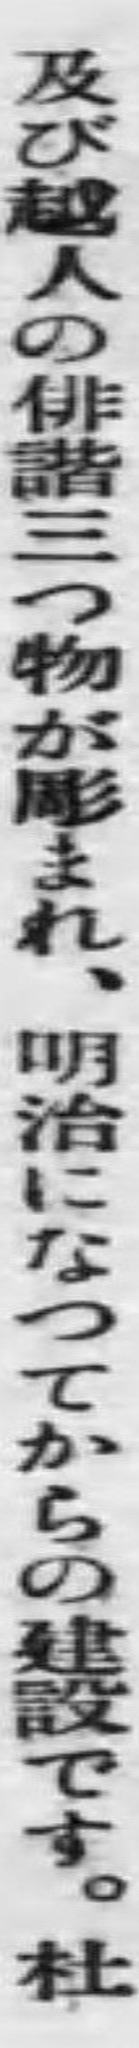及び越人の俳諧三つ物が彫まれ、明治になつてからの建設です。杜
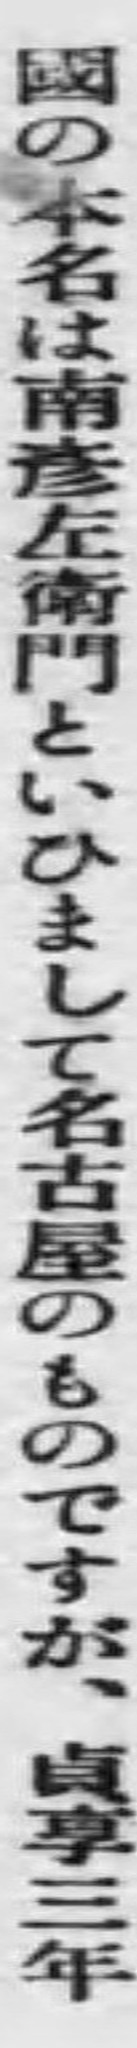国の本名は南彦左衛門といひまして名古屋のものですが、貞享三年
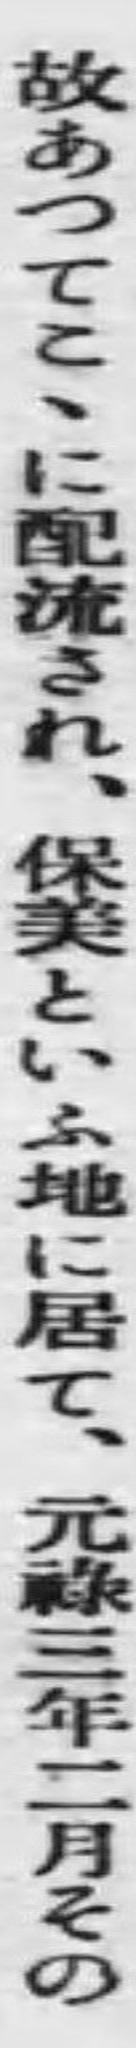故あつてこゝに配流され、保美といふ地に居て、元禄三年二月その
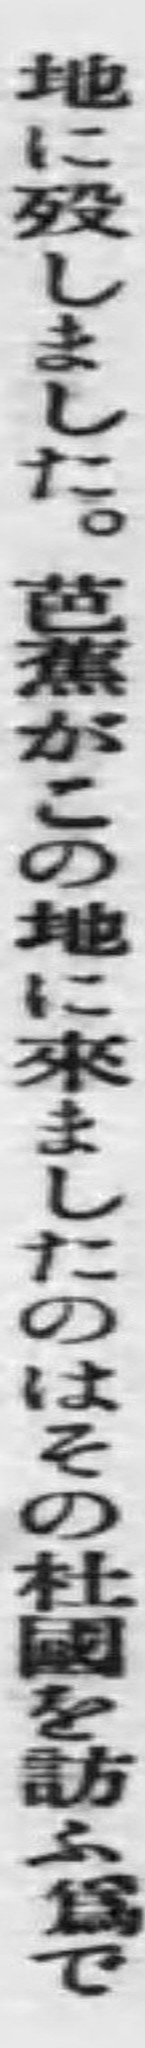地に歿しました。芭蕉がこの地に来ましたのはその杜国を訪ふ為で
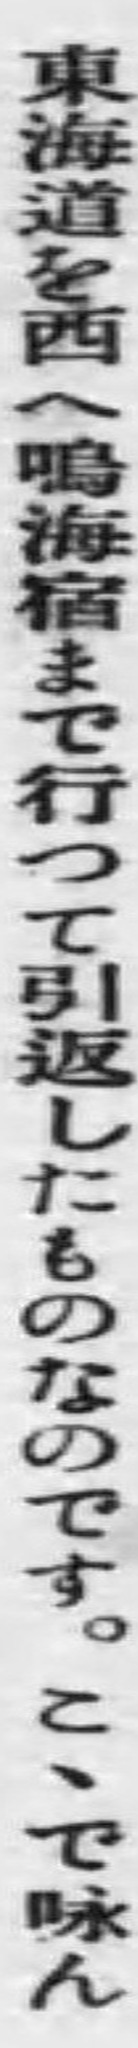東海道を西へ鳴海宿まで行つて引返したものなのです。こゝで咏ん
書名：東三河道中記 : 豊橋市及其附近案内
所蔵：国立国会図書館 National Diet Library, JAPAN
